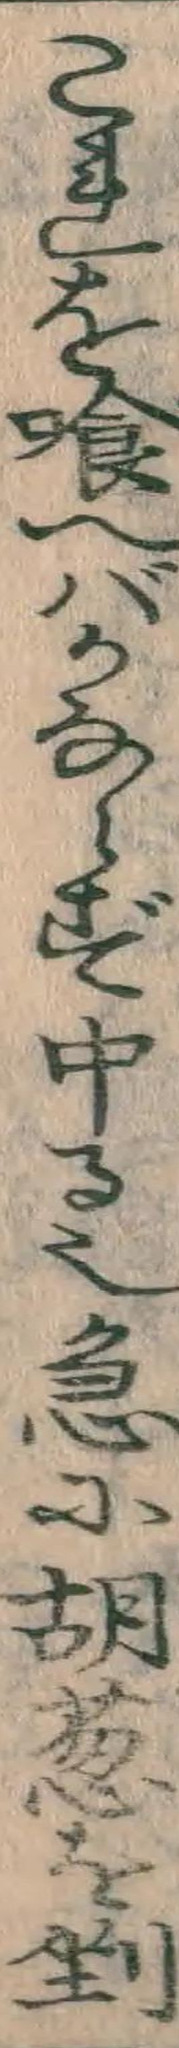これを喰へばかならず中る也急に胡葱を剉
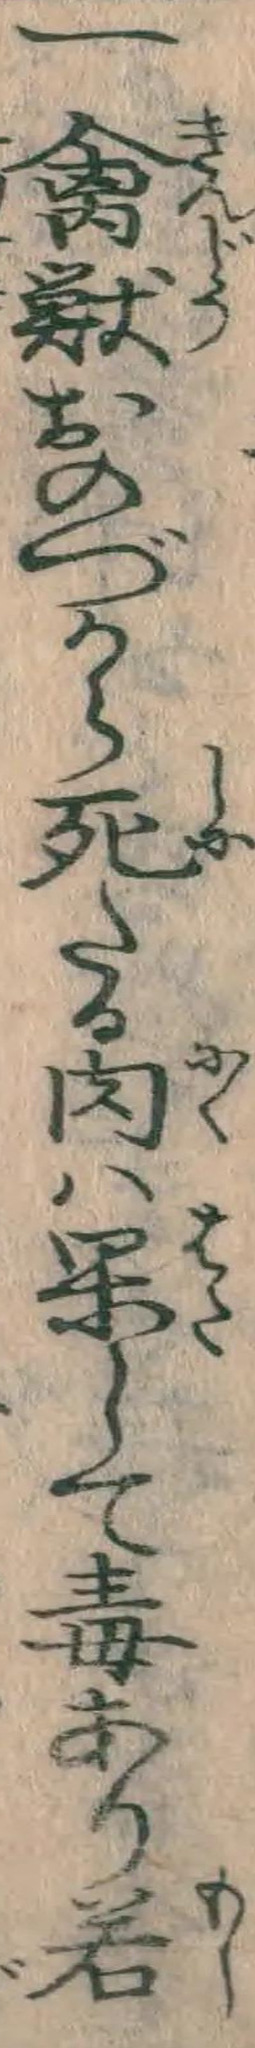一禽獣おのづから死たる肉は果して毒あり若
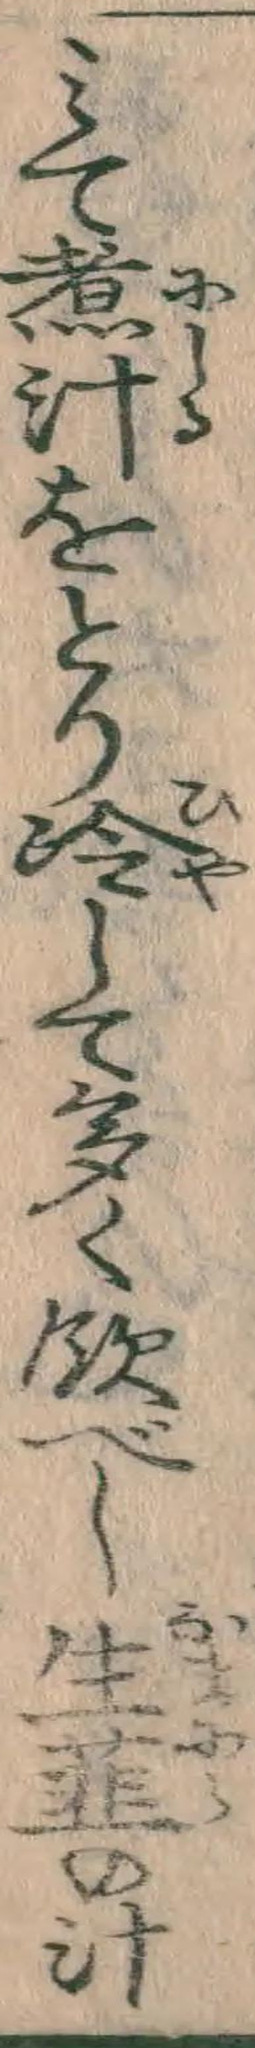みて煮汁をとりひやし冷して多く飲べし生韮の汁
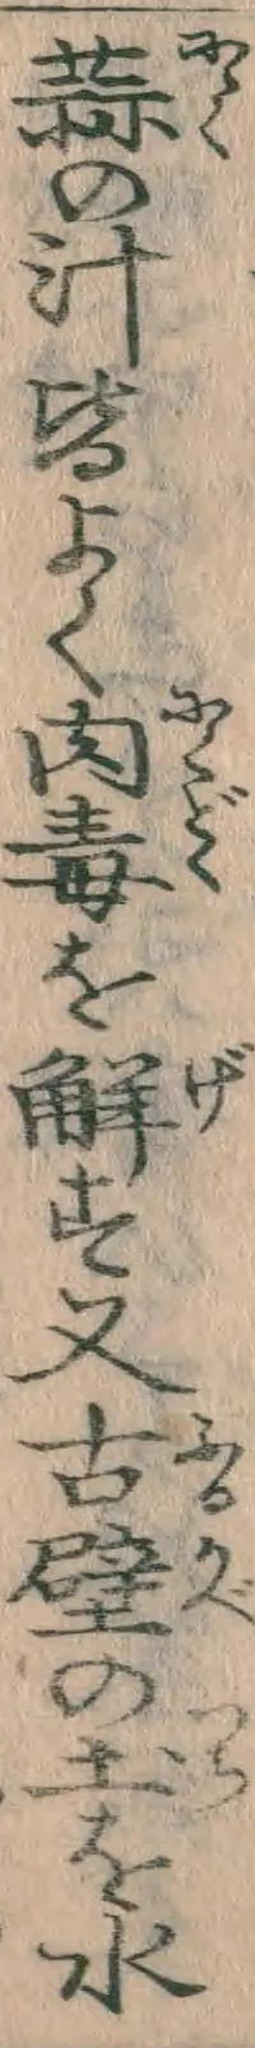蒜の汁皆よく肉毒を解す又古壁の土を水
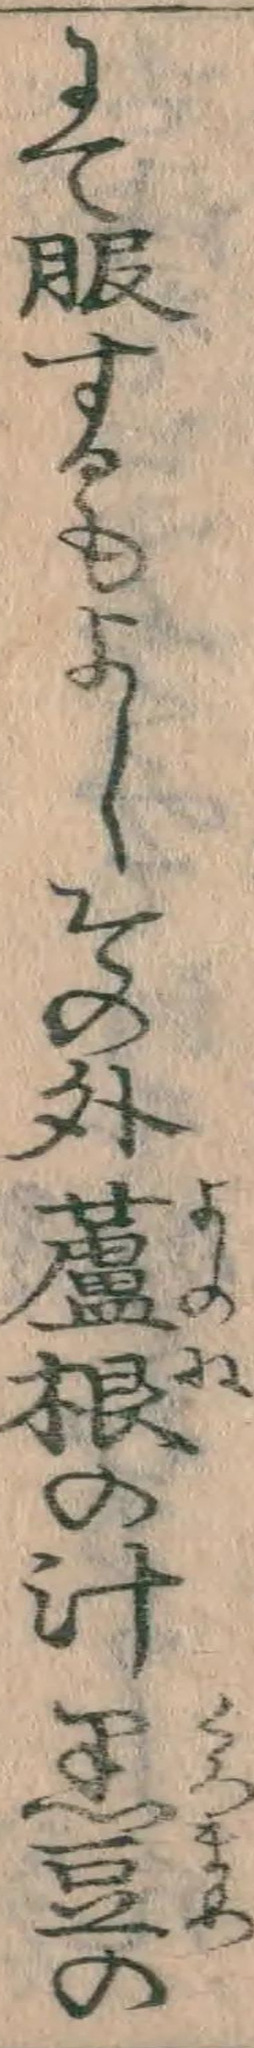にて服するもよしその外蘆根の汁黒豆の
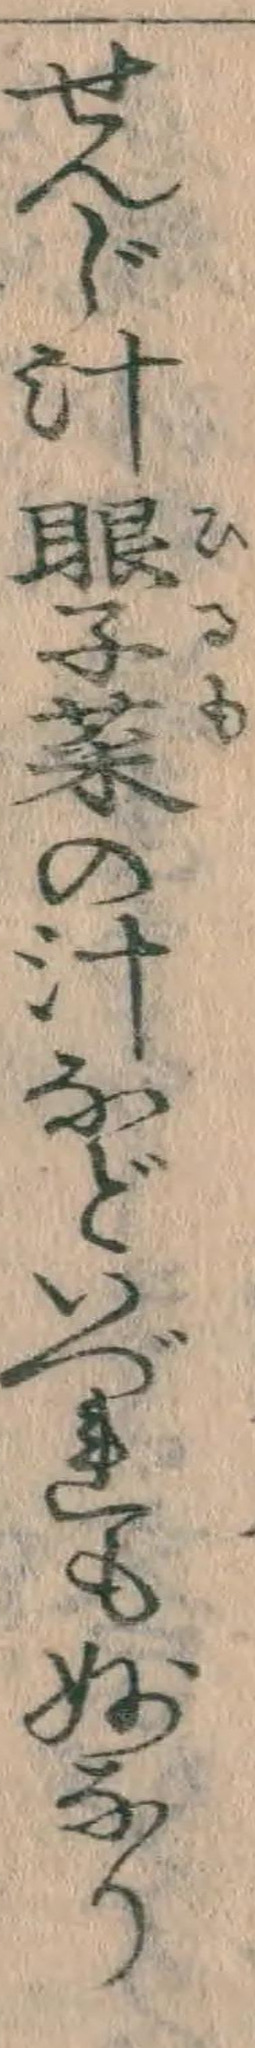せんじ汁眼子菜の汁などいづれも妙なり
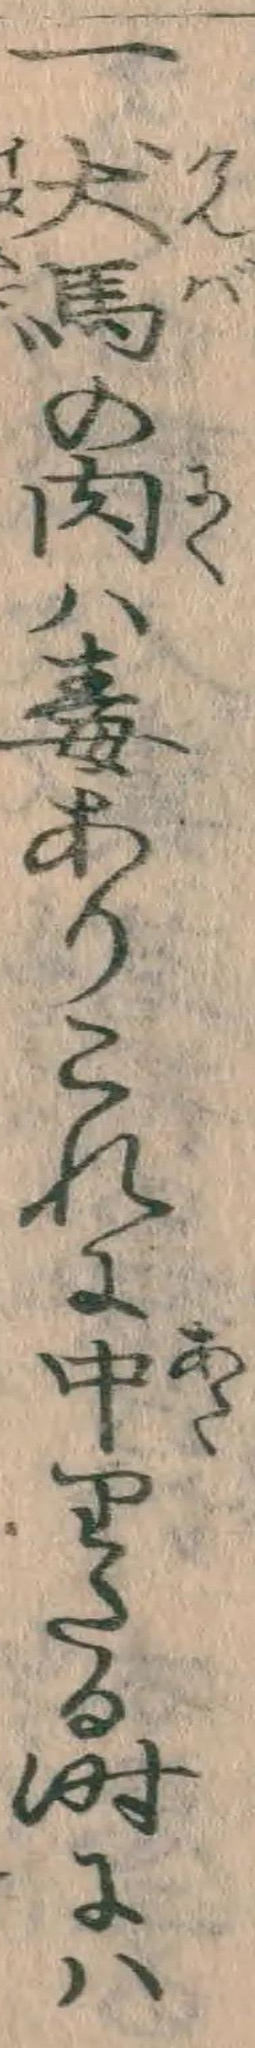一犬馬の肉は毒ありこれに中りたる時には
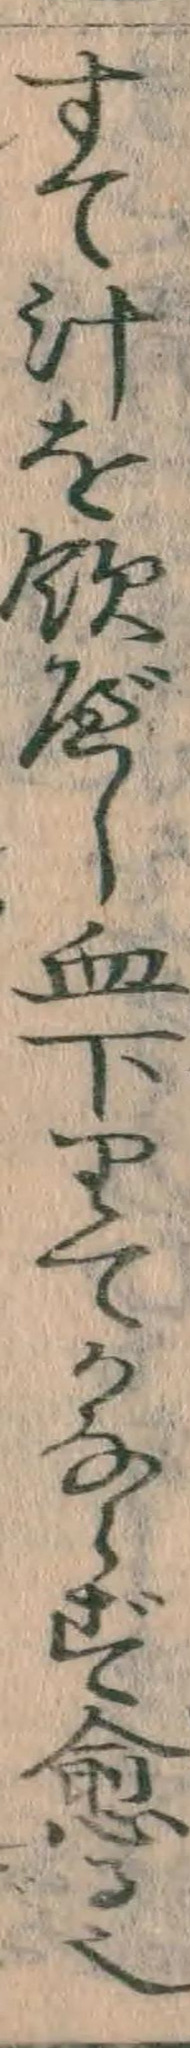すて汁を飲べし血下りてかならず愈る也
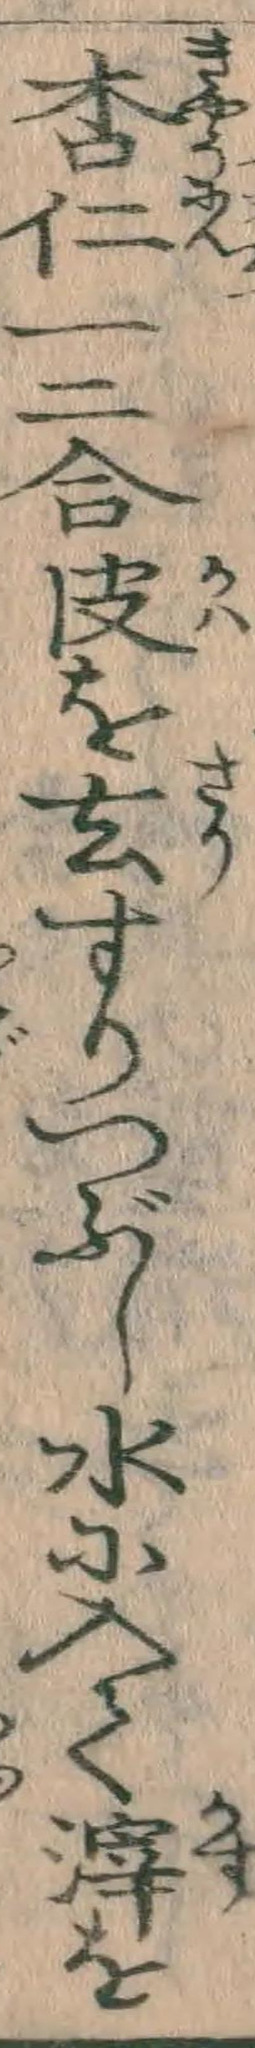杏仁一二合皮を去すりつぶし水に入て滓を
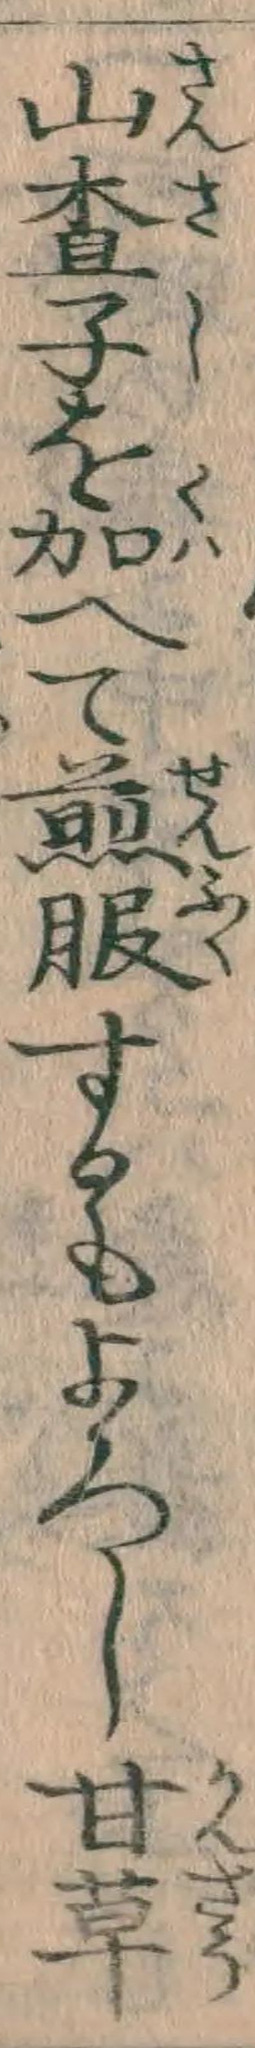山査子を加へて煎服するもよろし甘草
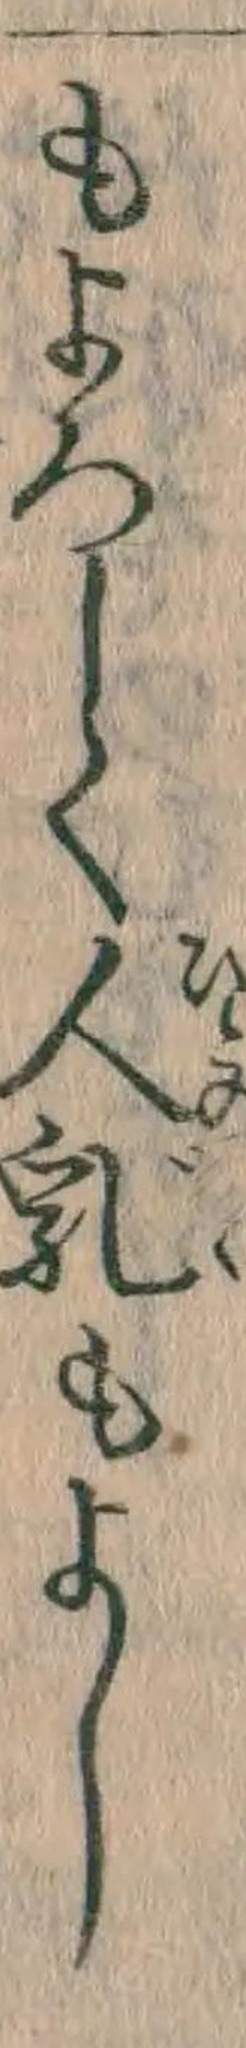もよろしく人乳もよし
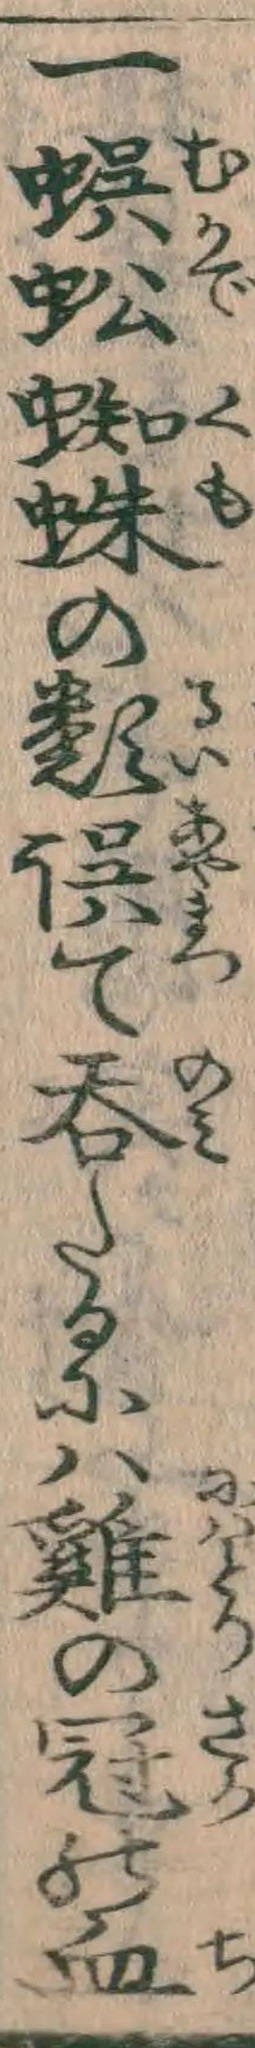一蜈蚣蜘蛛の類誤て吞たるには鶏の冠の血
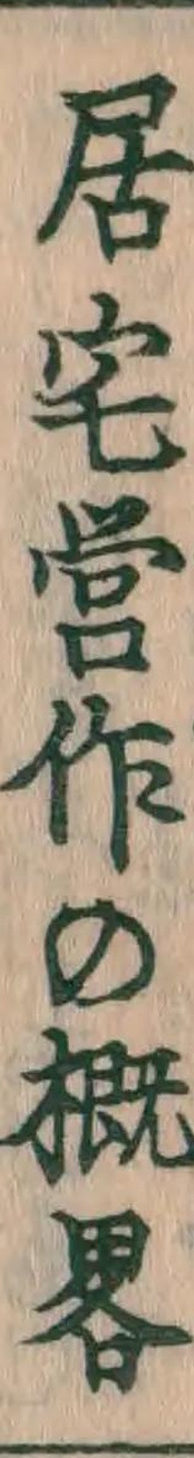居宅営作の概略
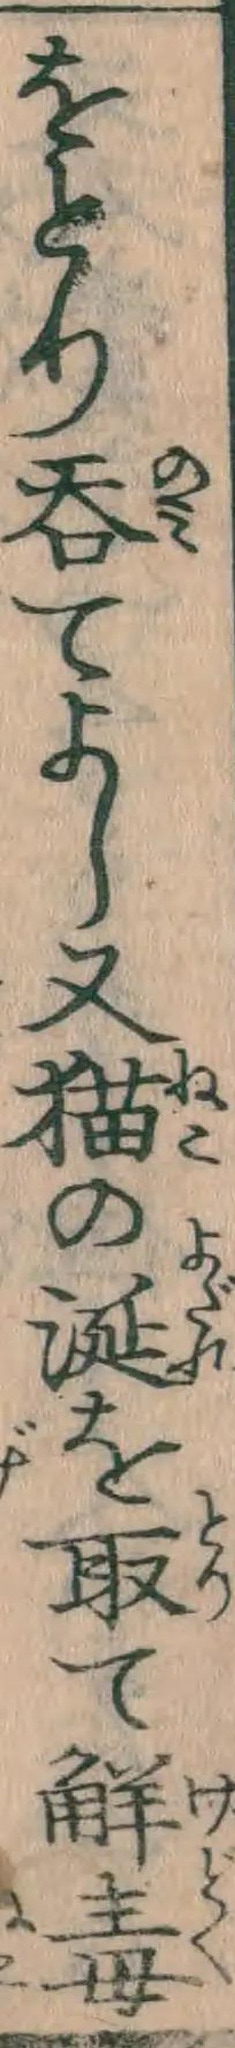をとり吞てよし又猫の涎を取て解毒
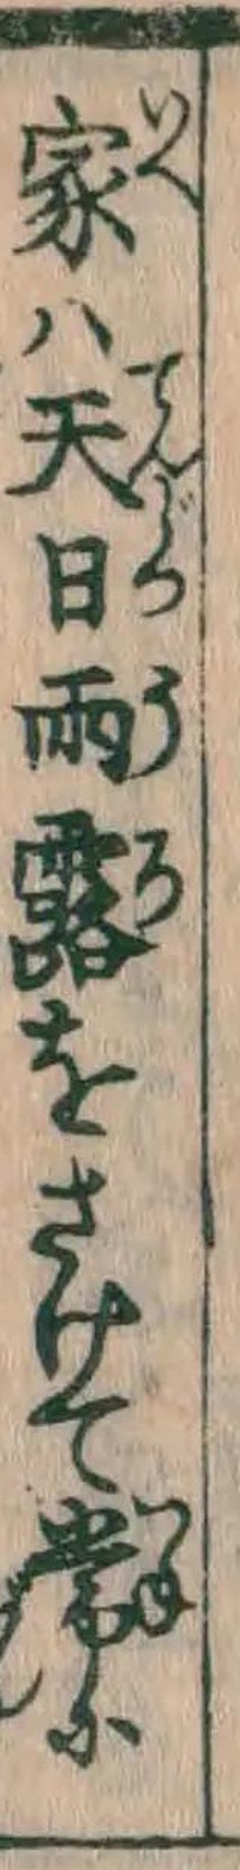家は天日雨露をさけて常に
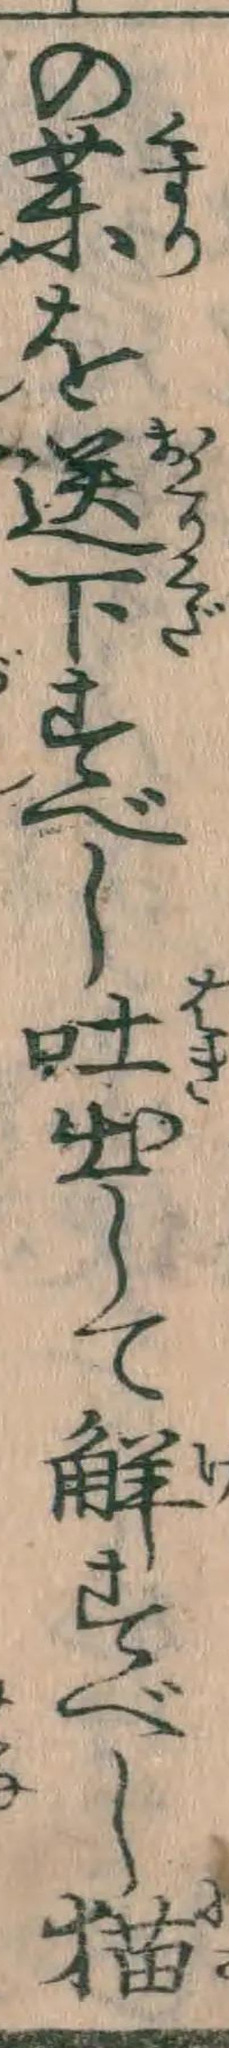の薬を送下すべし吐出して解すべし猫
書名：広益秘事大全 3巻. [3]
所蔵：国立国会図書館 National Diet Library, JAPAN
